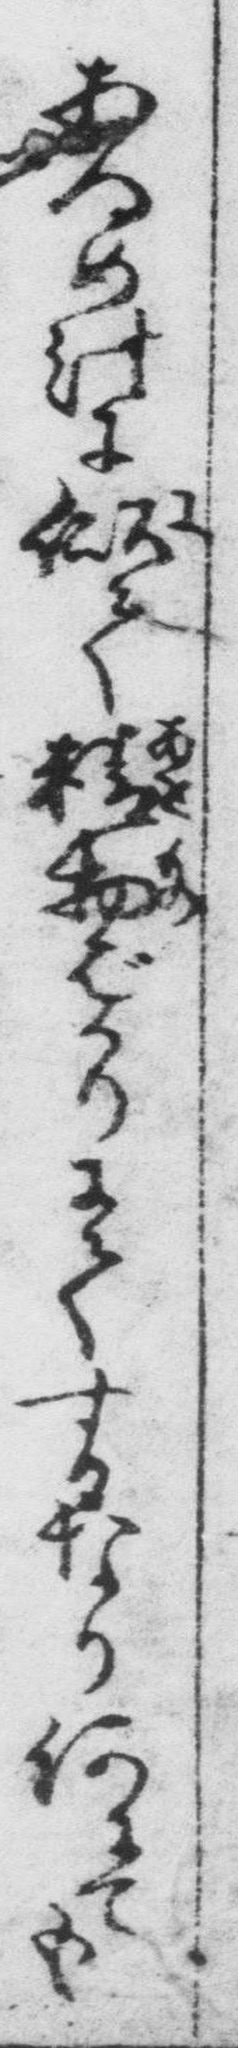あつめ汁に似て青物ばかりにてするなり何にても
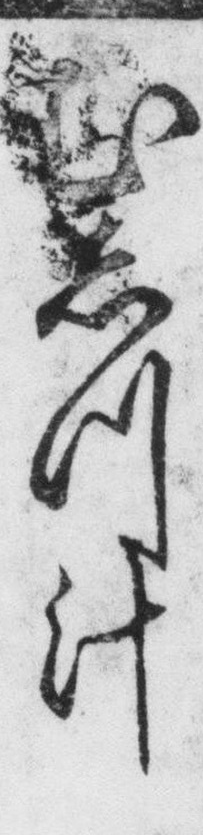むしつ汁
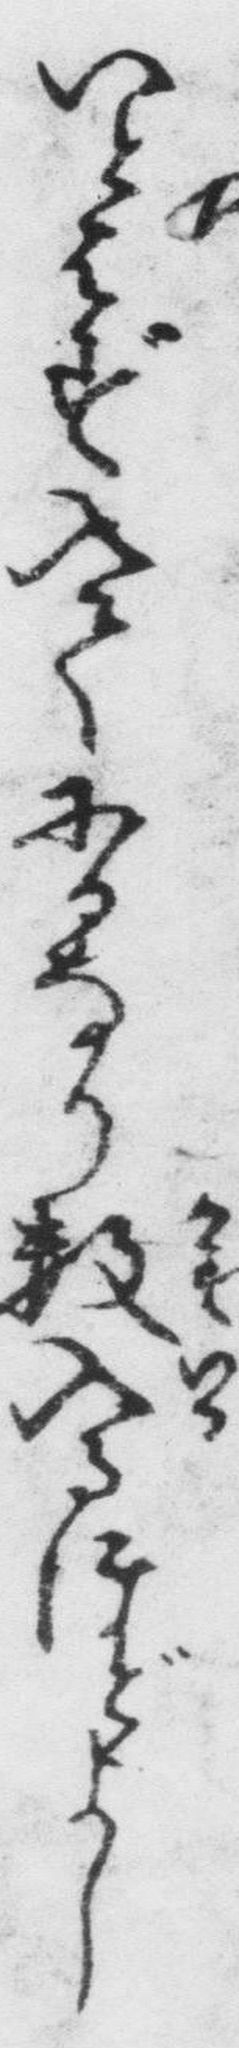いとはず入てにるなり数入るほどよし
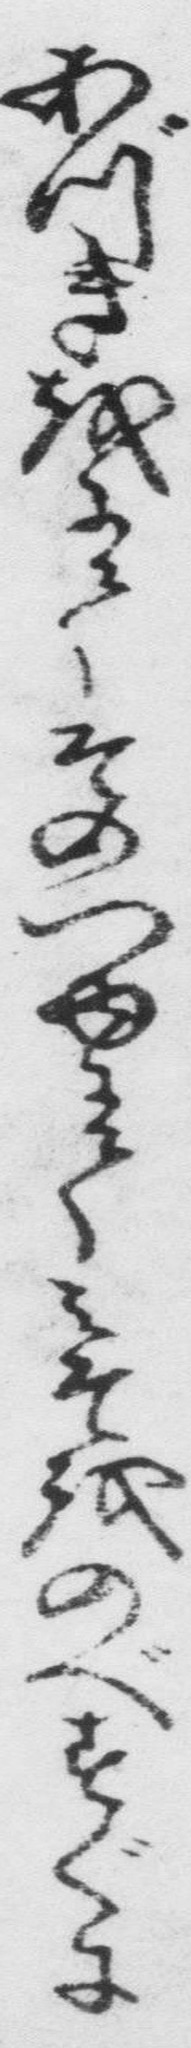あづきをにてそのつゆにてみそをのべすぐに
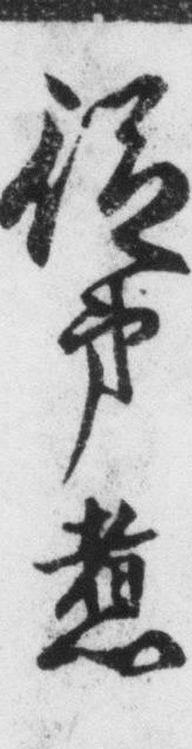従弟煮
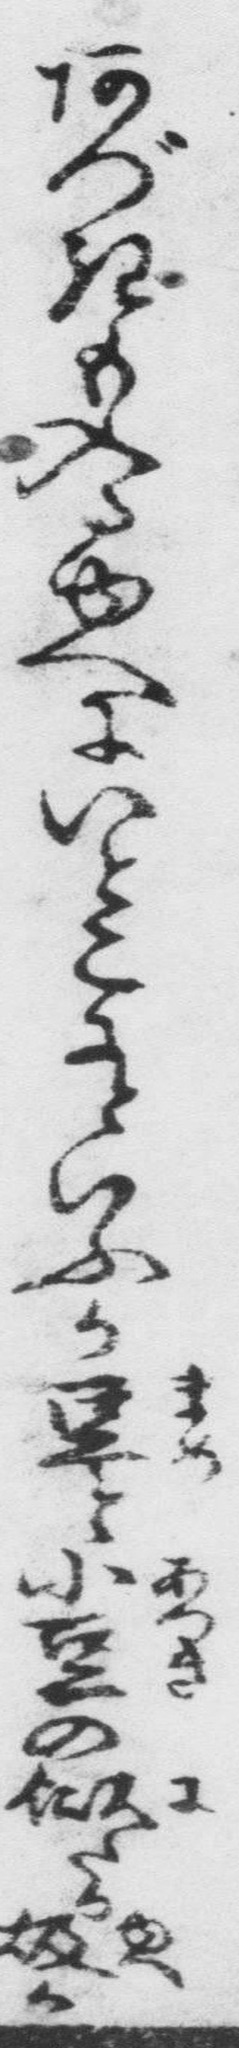あづきも入るゆへいとこにといふか豆と小豆の似たる故か
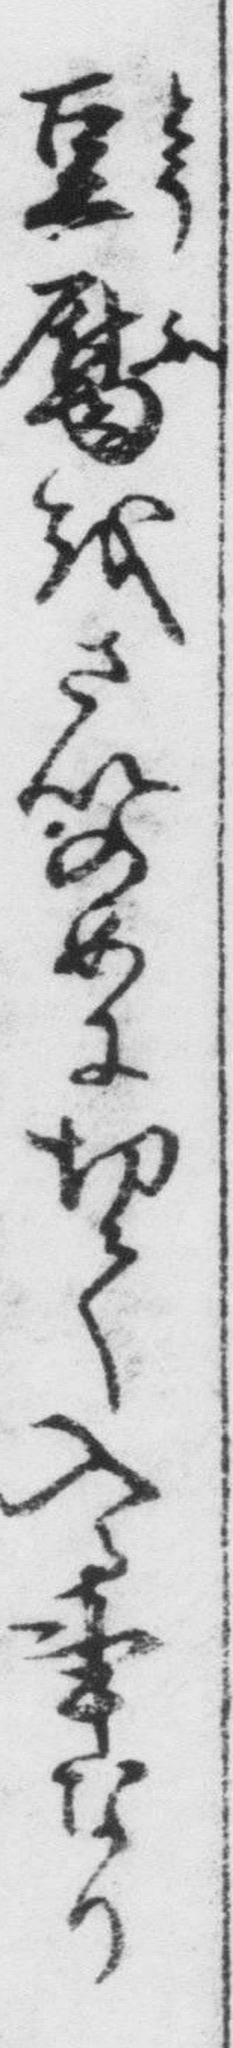豆腐をさいのめに切て入る事なり
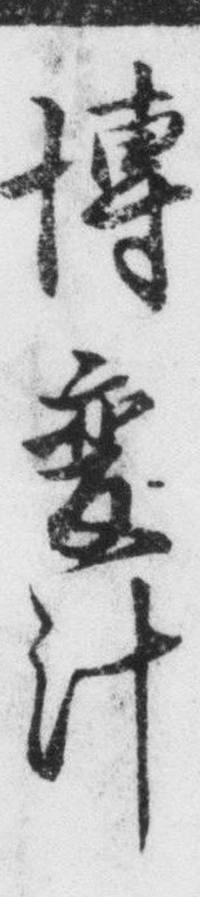博奕汁
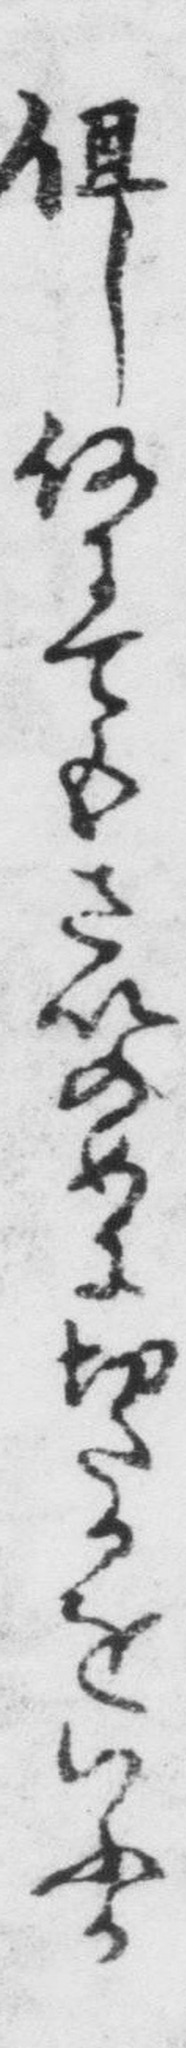但し何にてもさいのめに切たるをいふか
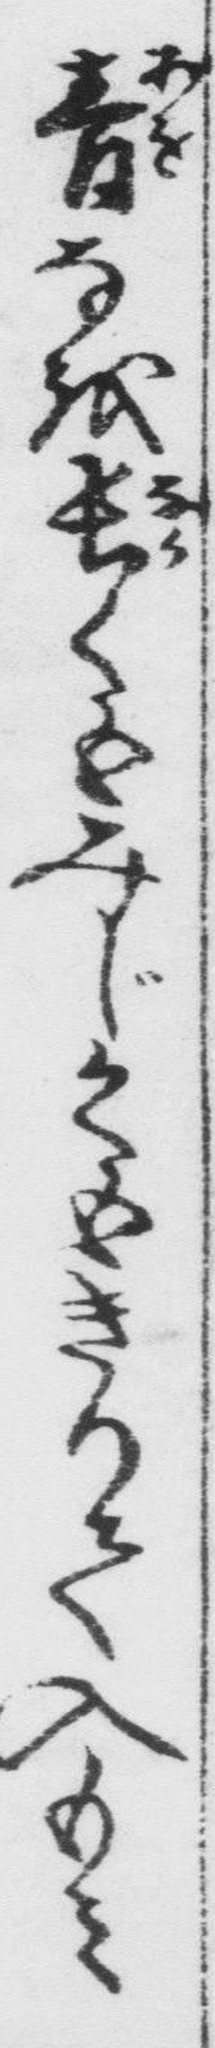青なを長くもみじかくもきりて入れもみ
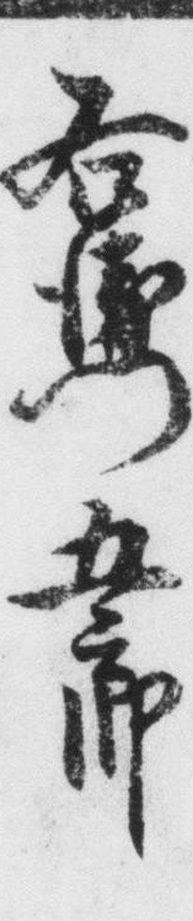右衛門五郎
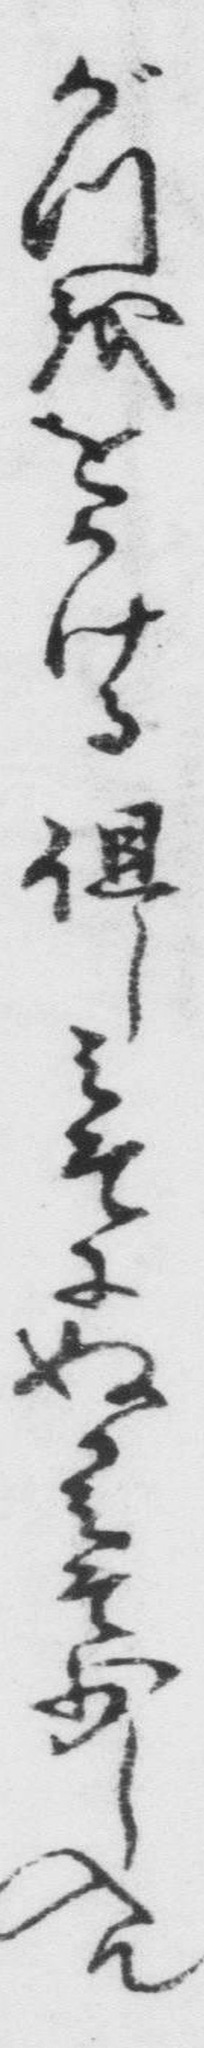がつををかける但しみそにぬかみそ少し入る
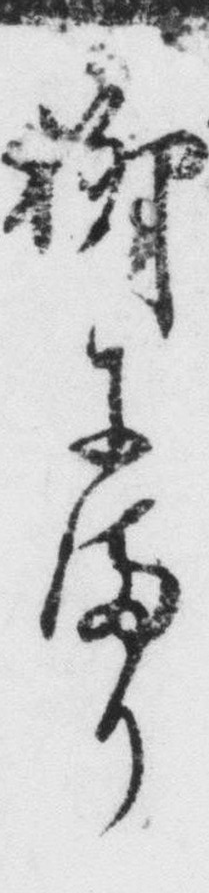柳にまり
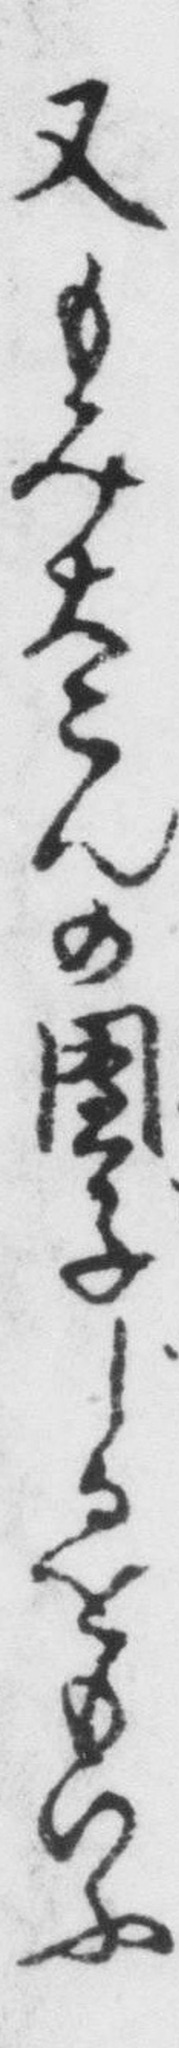又もみ大こんの団子じるをもいふ
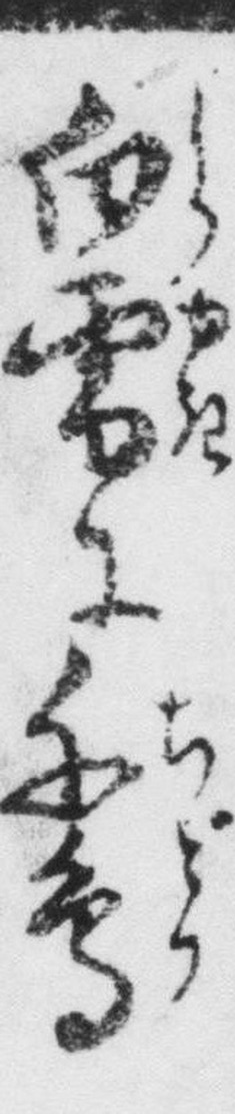白雪に千鳥
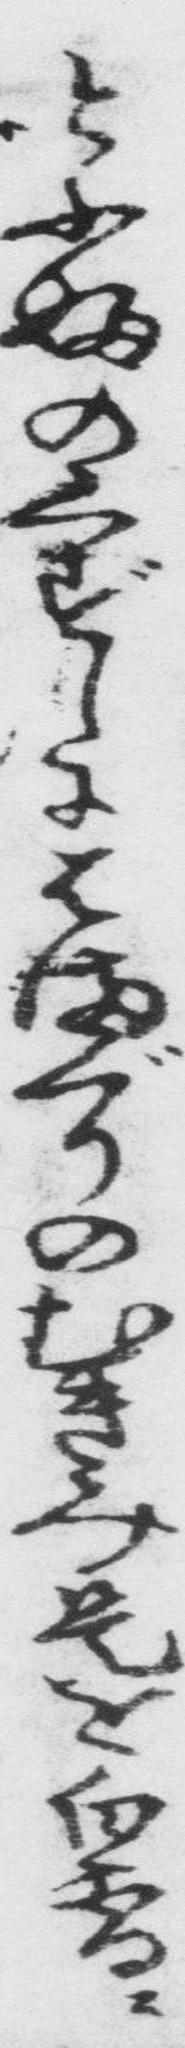とふふのくずしにはまぐりのむきみ是を白雪又
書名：料理早指南
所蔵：大阪府立大学学術情報センター 国文学研究資料館
